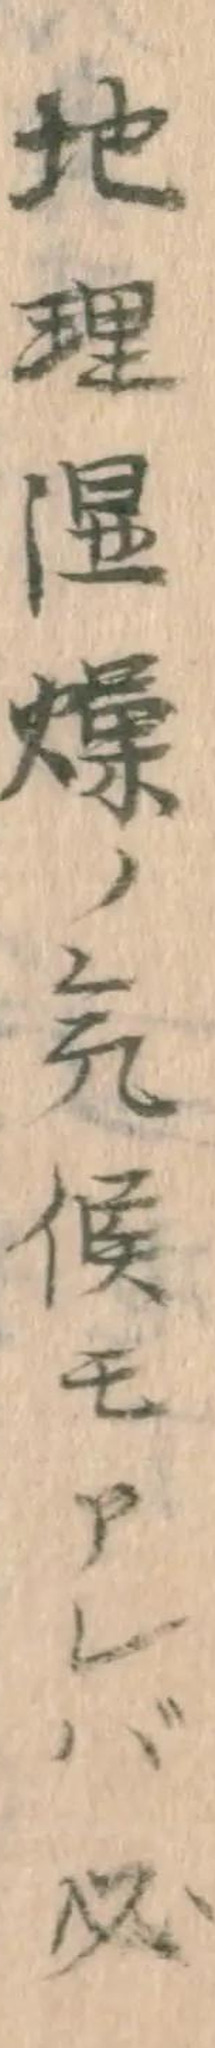地理湿燥ノ気候モアレバ必
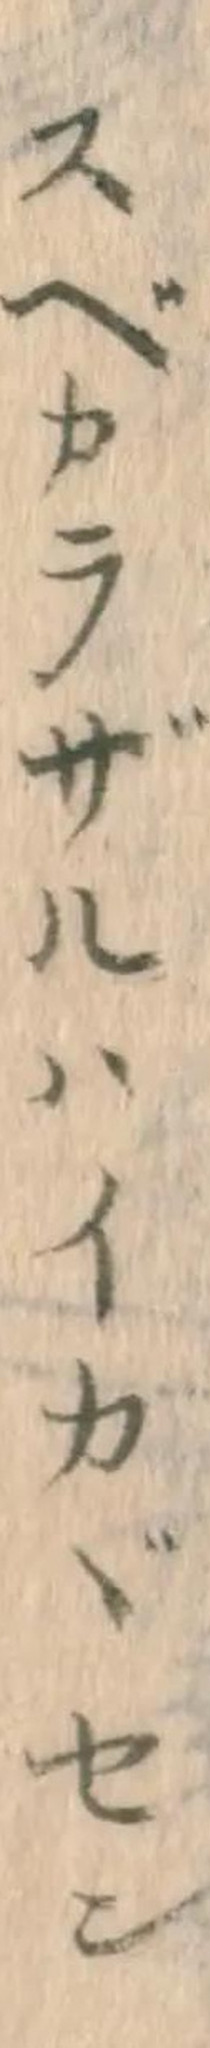スベカラザルハイカヾセン

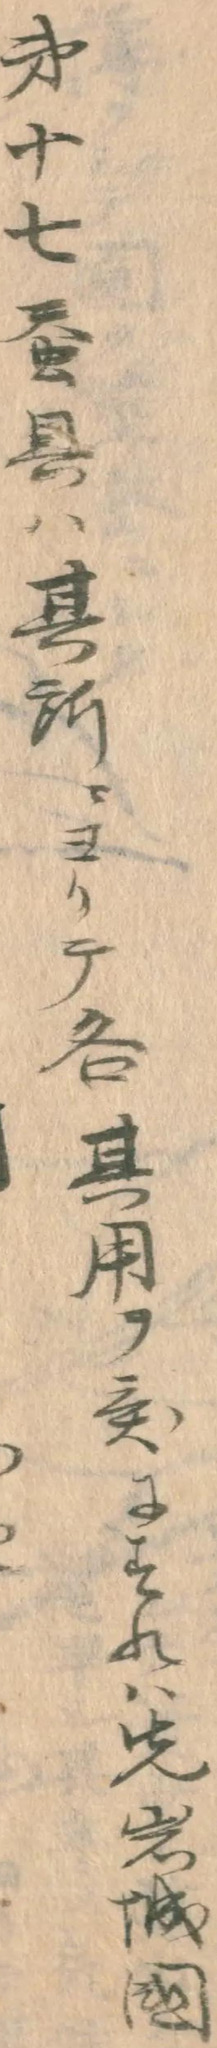第十七蚕具ハ其所ニヨリテ各其用ヲ異にすれハ先岩城国
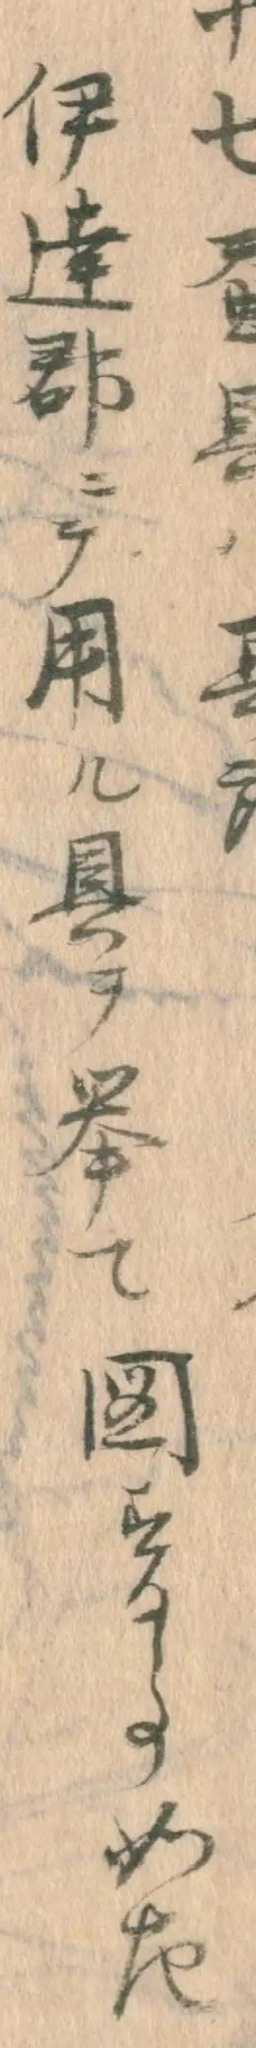伊達郡ニテ用ル具ヲ挙て図する事如左
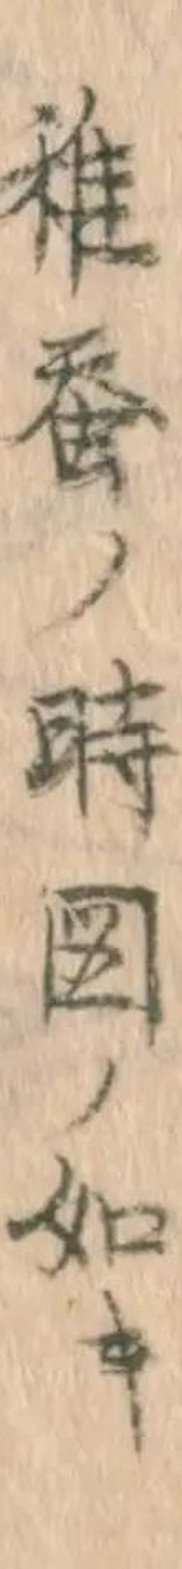稚蚕ノ時図ノ如キ
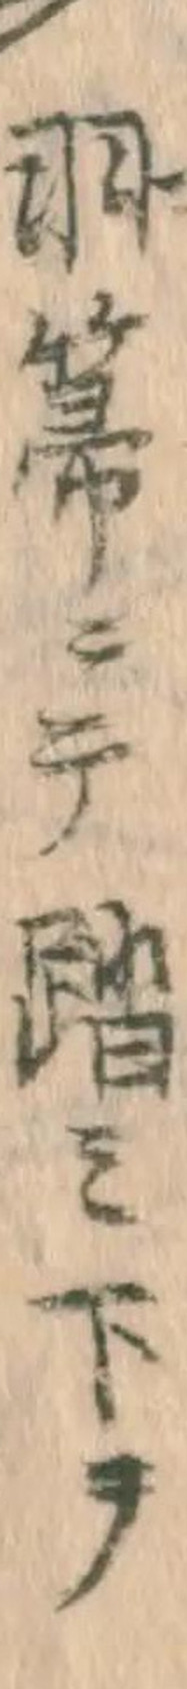羽箒ニテ踏ミ下ヲ
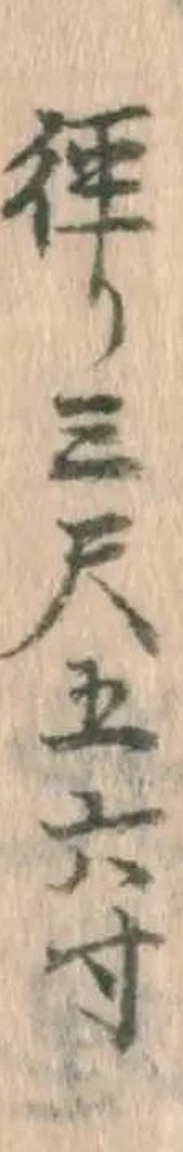径リ三尺五六寸
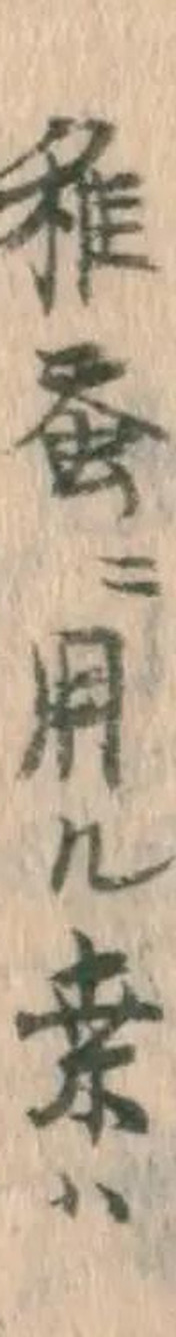稚蚕ニ用ル桑ハ
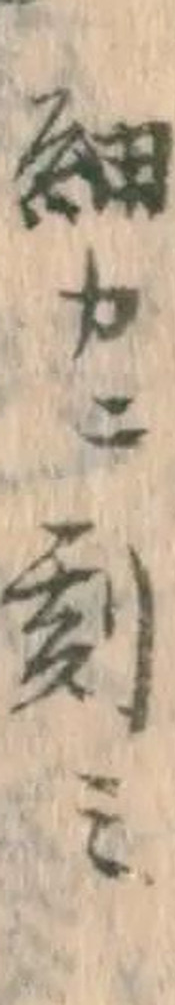細カニ刻ミ
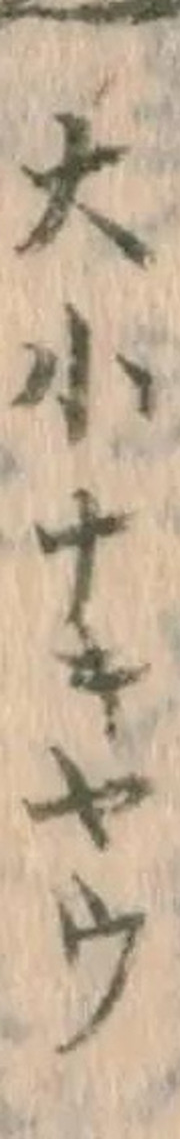大小ナキヤウ
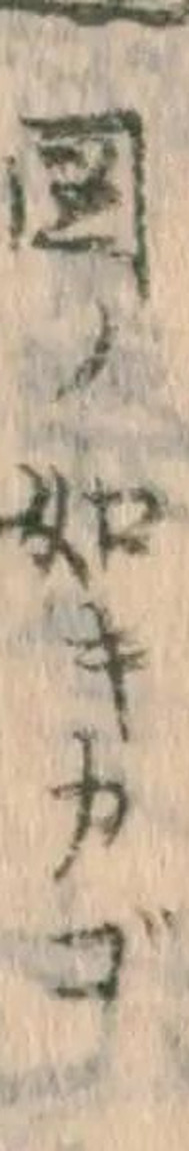図ノ如キカゴ
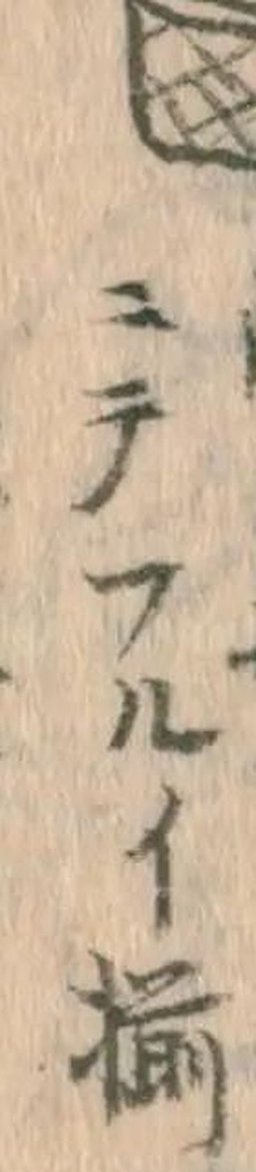ニテフルイ揃フ
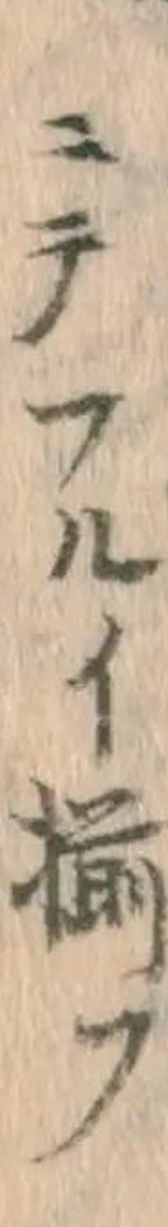ニテフルイ揃フ
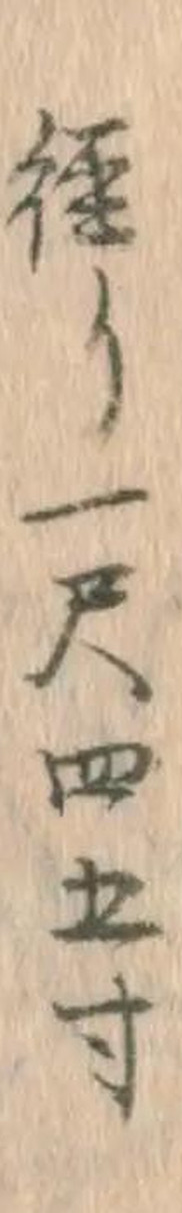径リ一尺四五寸
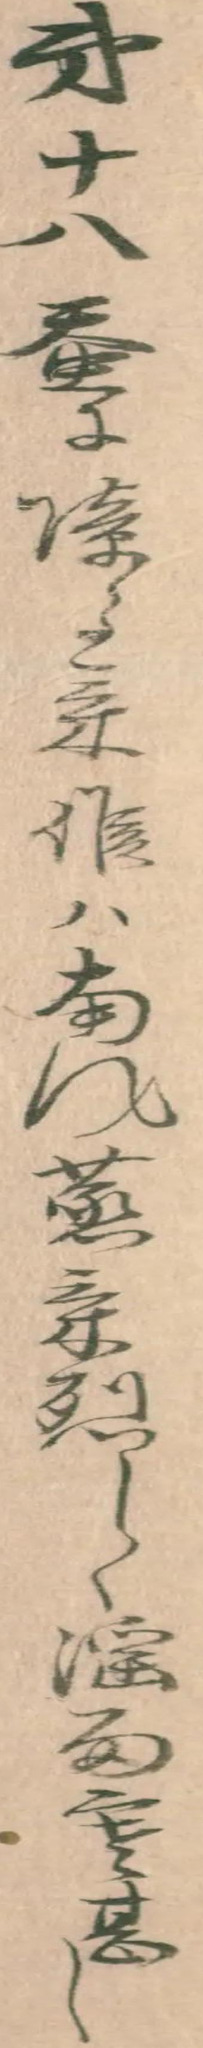第十八蚕に障る気候ハ南風蒸気烈しく滛雨寒甚し
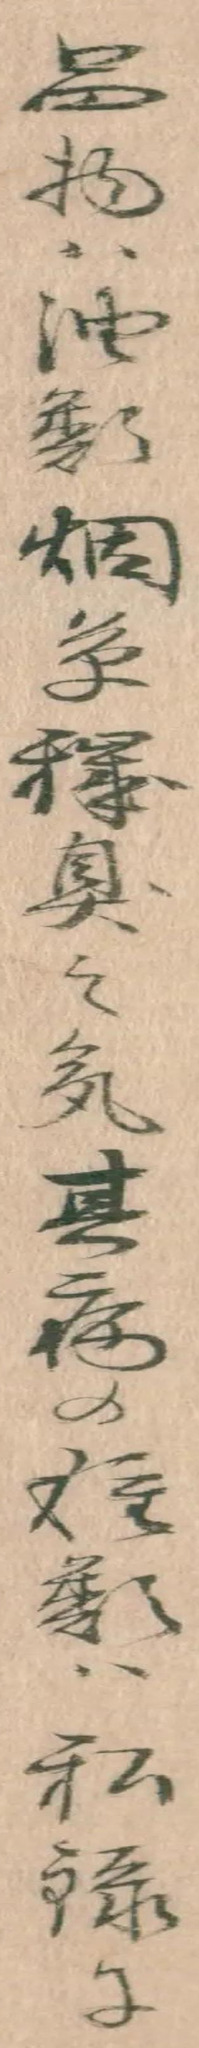品物ハ油類烟草穢臭之気其病の種類ハ私録に
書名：蚕桑集成
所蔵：国立国会図書館 National Diet Library, JAPAN
